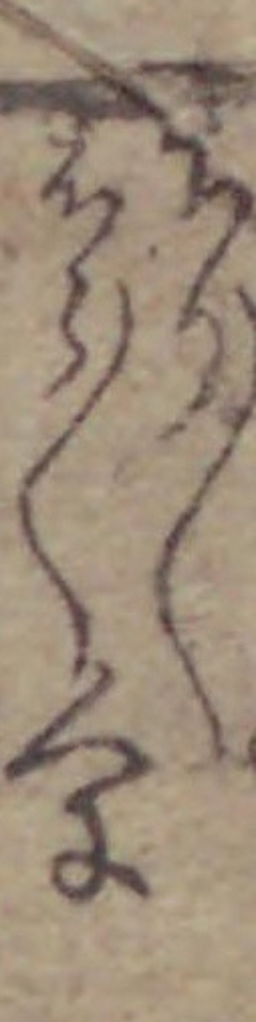はら〳〵と人に
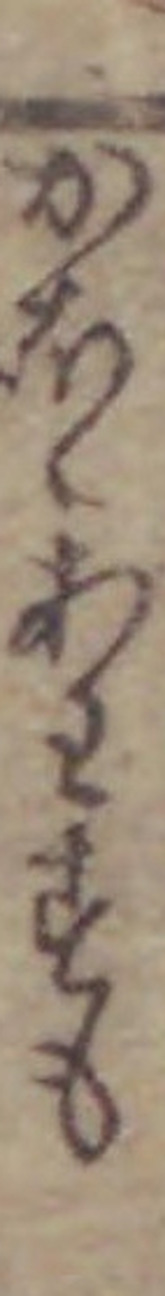かほあわすも
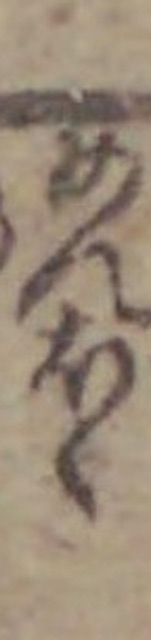めんぼく
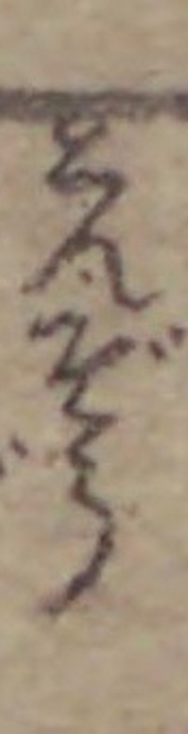こんぞう
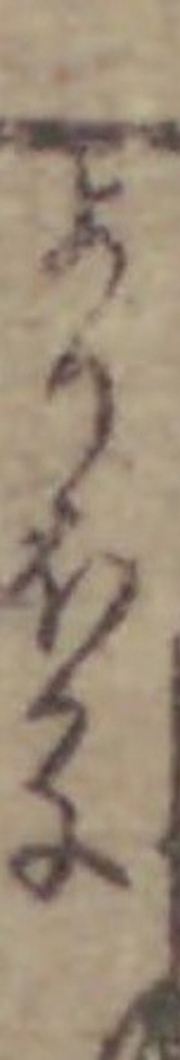よりほかに
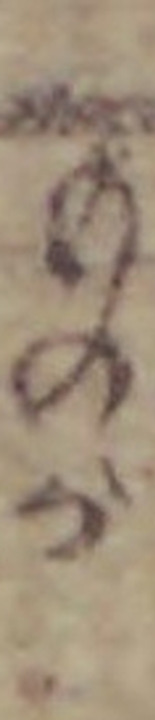ものが
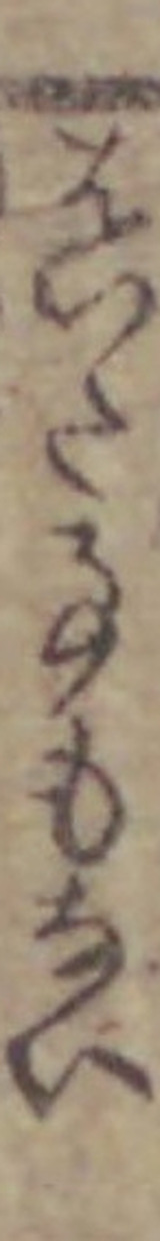はいた事もない
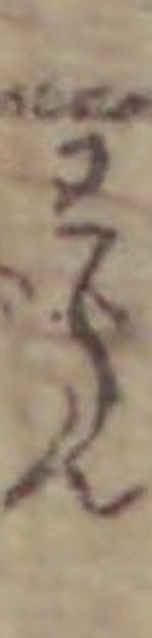わらん
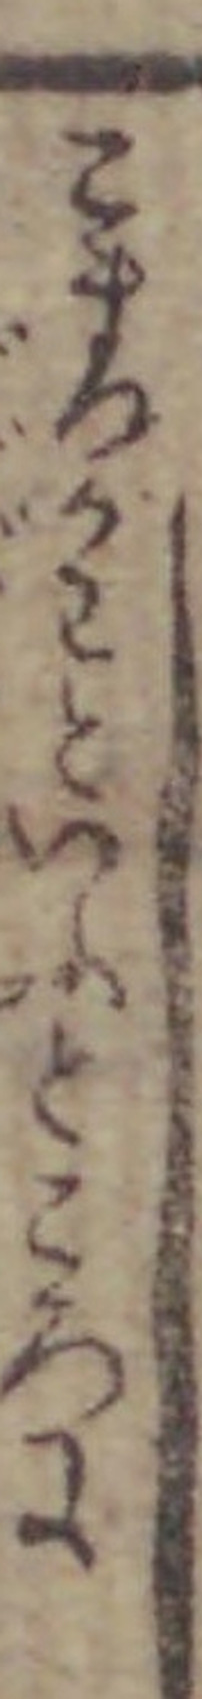こまつかわといふところに
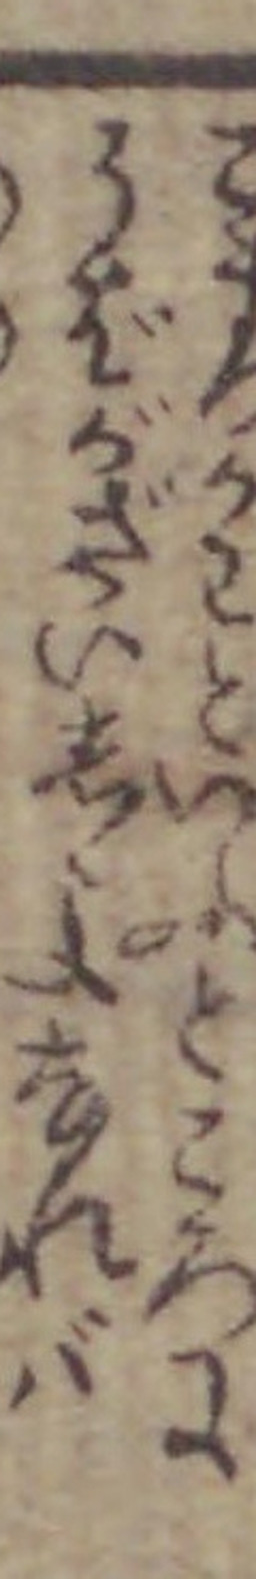うばがざいしよなれば
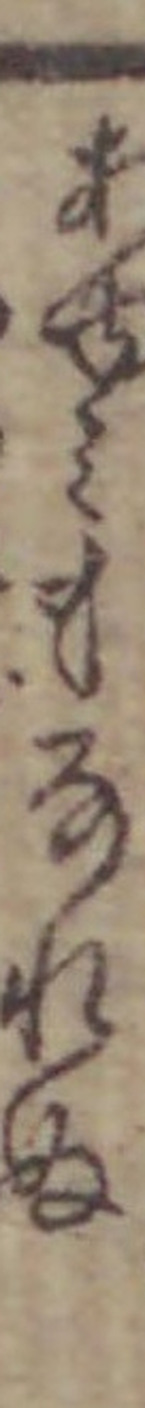あゆみもなれぬ
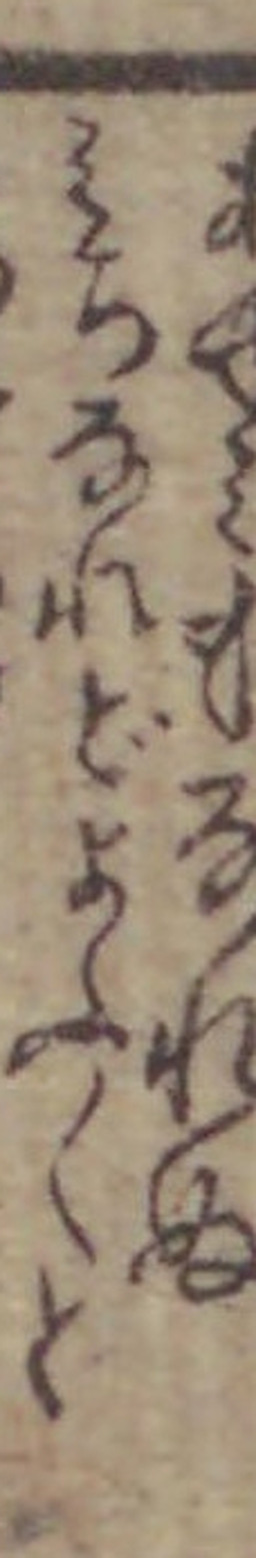みちなれどよふ〳〵と
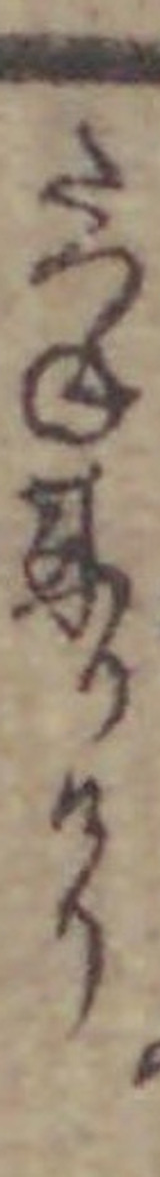たつね来りけり
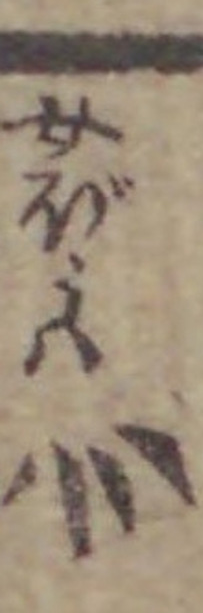女ぼうは
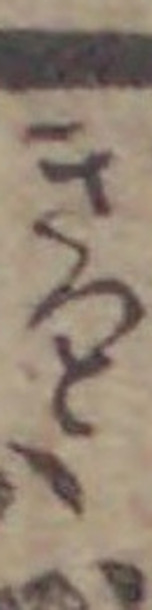きつと
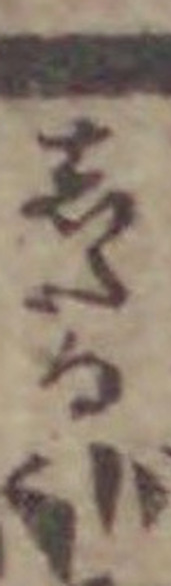したる
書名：御代の御寶
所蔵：国立国会図書館 National Diet Library, JAPAN
